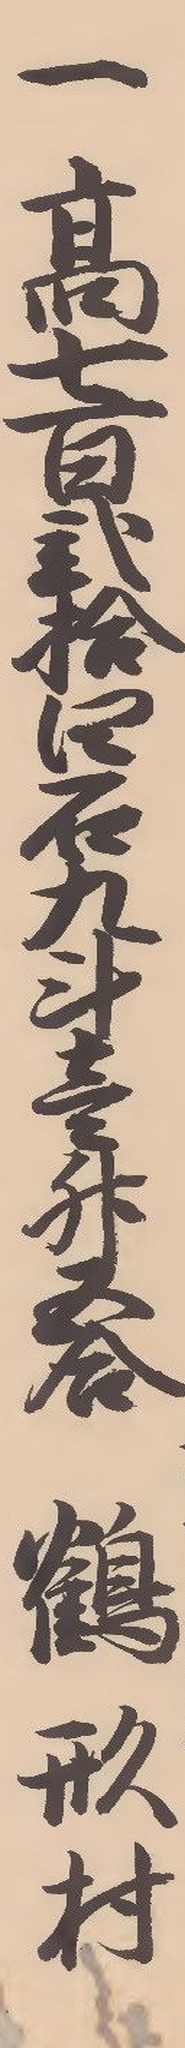一高七百弐拾四石九斗壱升五合鶴形村
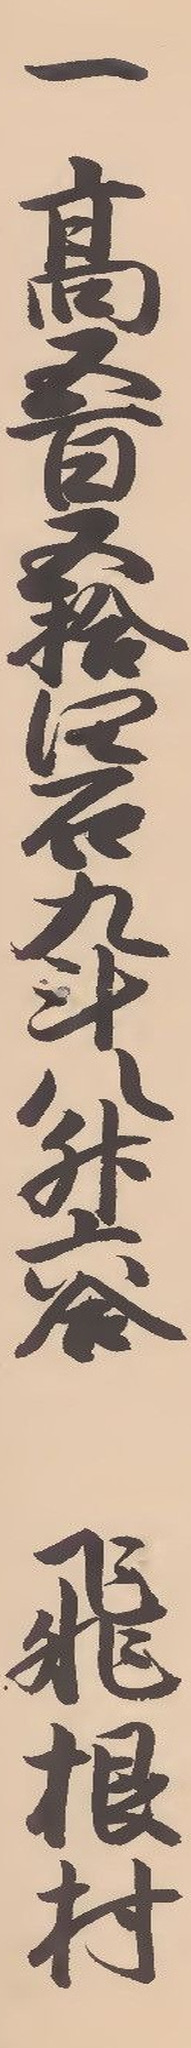一高五百五拾四石九斗八升六合飛根村
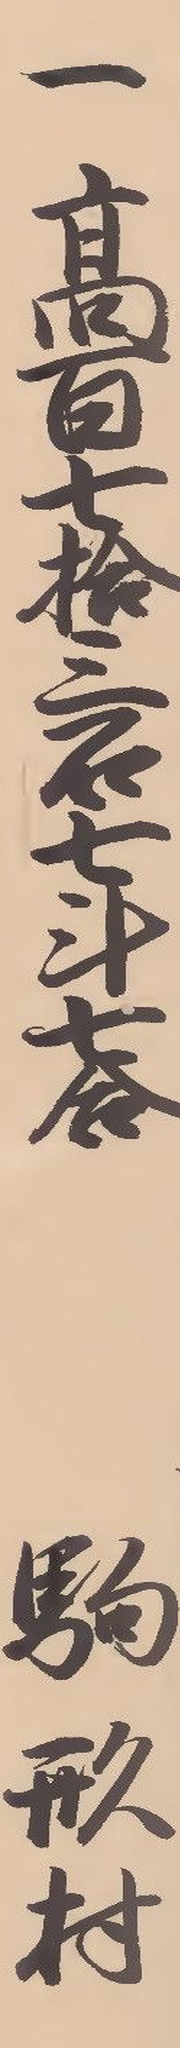一高百七拾三石七斗七合駒形村
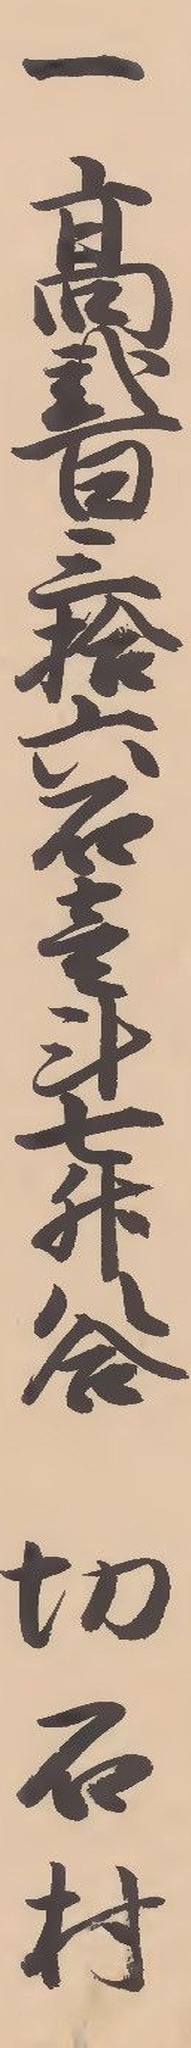一高弐百三拾六石壱斗七升八合切石村
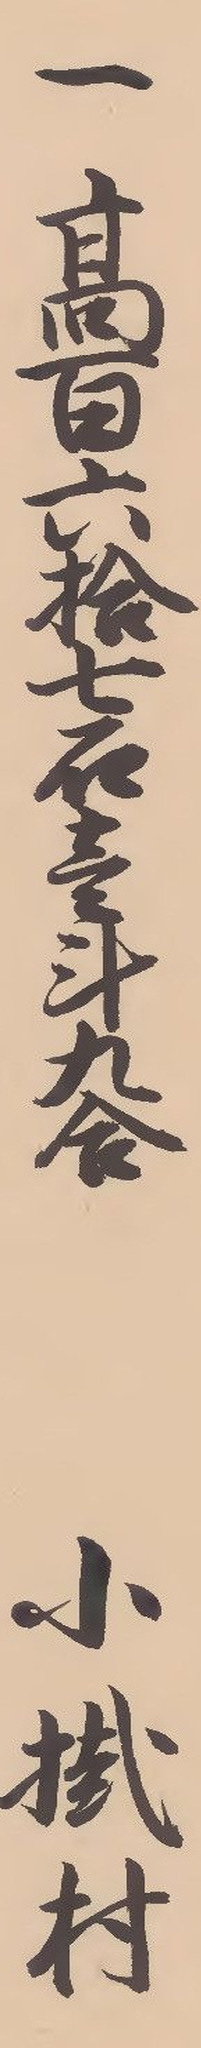一高百六拾七石壱斗九合小掛村
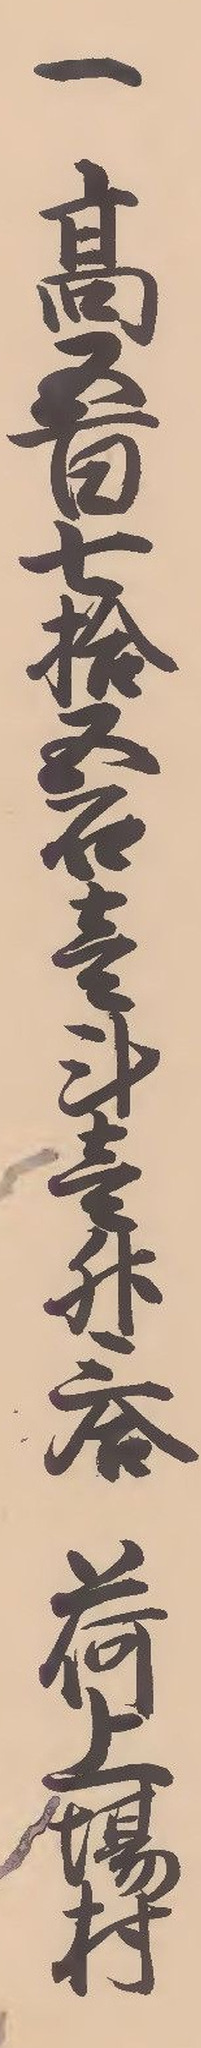一高五百七拾五石壱斗壱升三合荷上場村

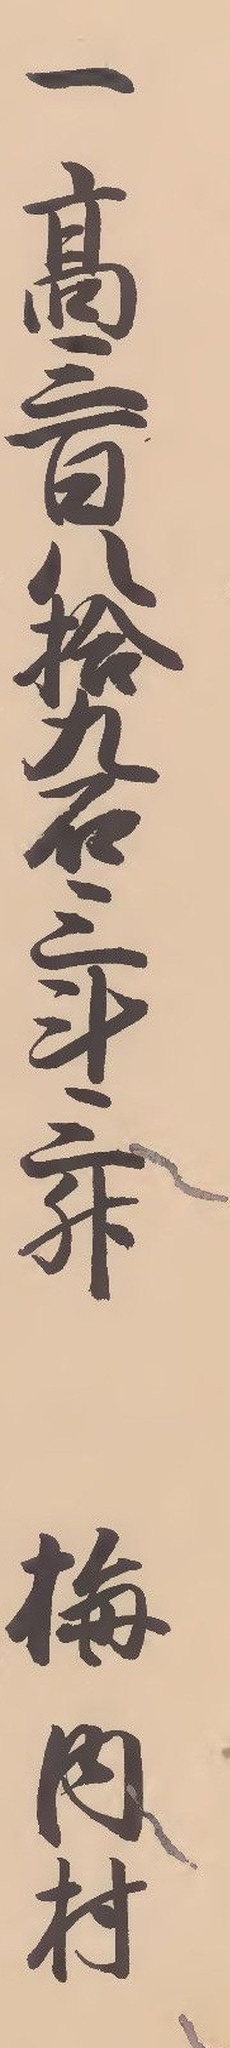一高三百八拾九石三斗三升梅内村
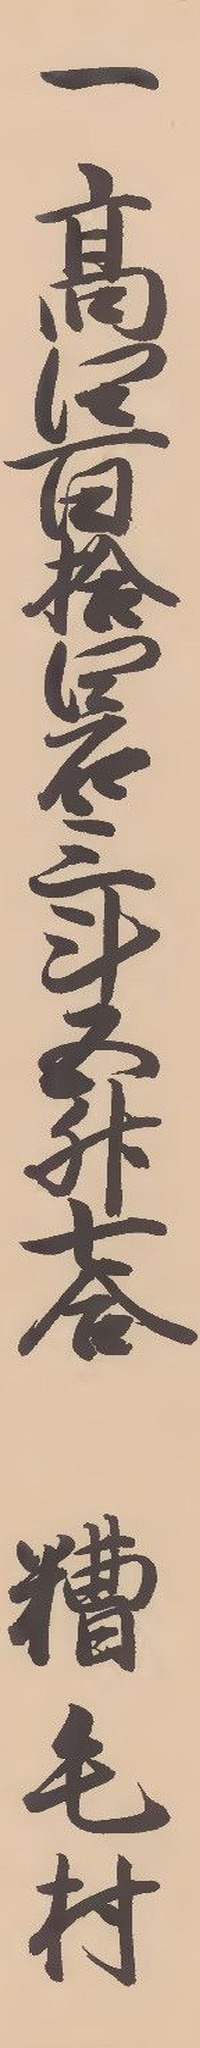一高四百拾四石三斗五升七合糟毛村
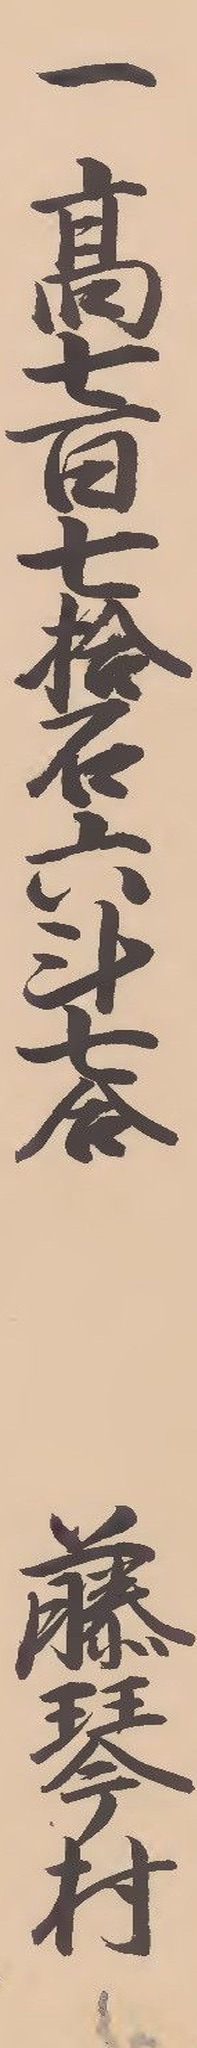一高七百七拾石六斗七合藤琴村
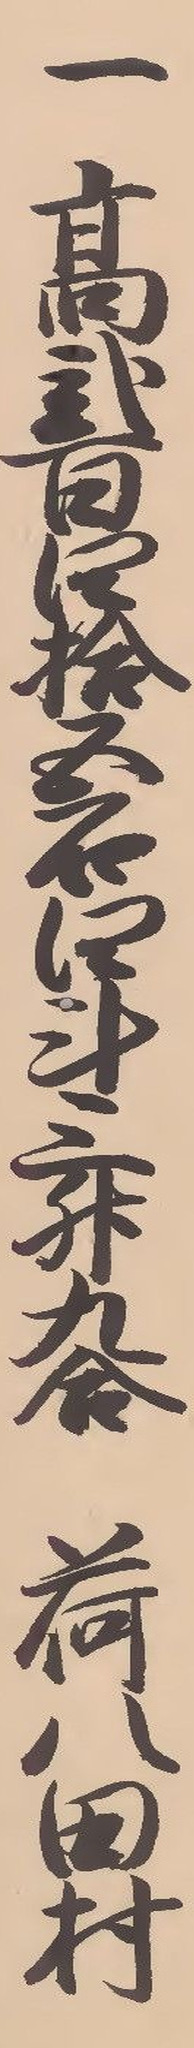一高弐百四拾五石四斗三升九合荷八田村
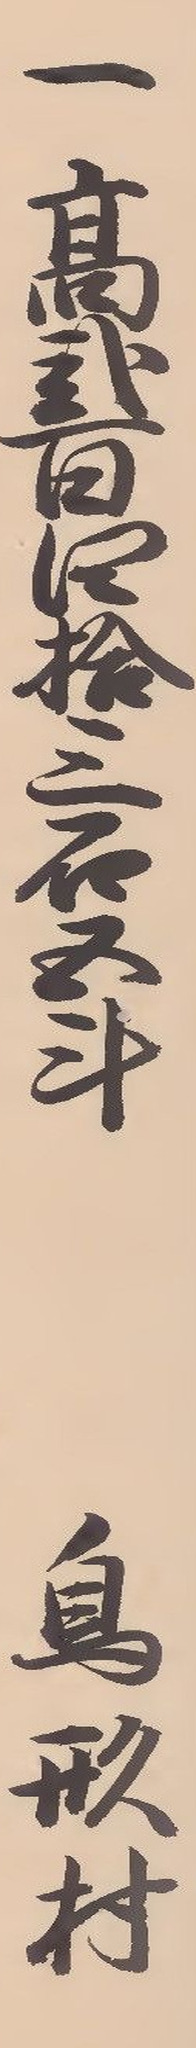一高弐百四拾三石五斗鳥形村
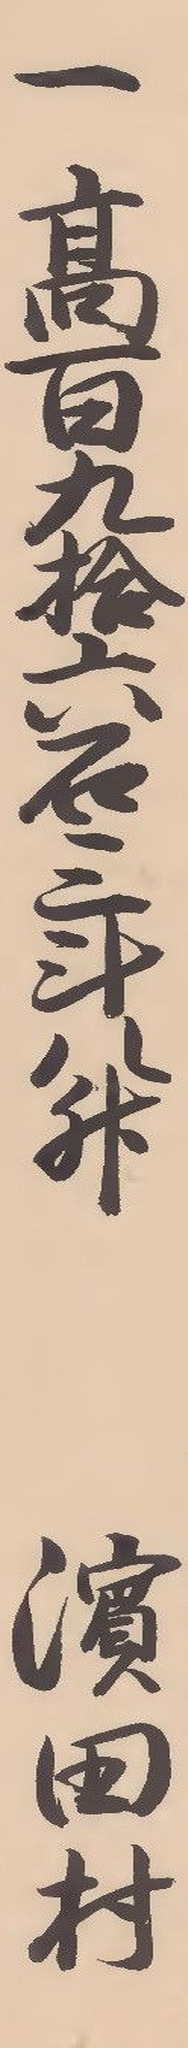一高百九拾六石三斗八升浜田村
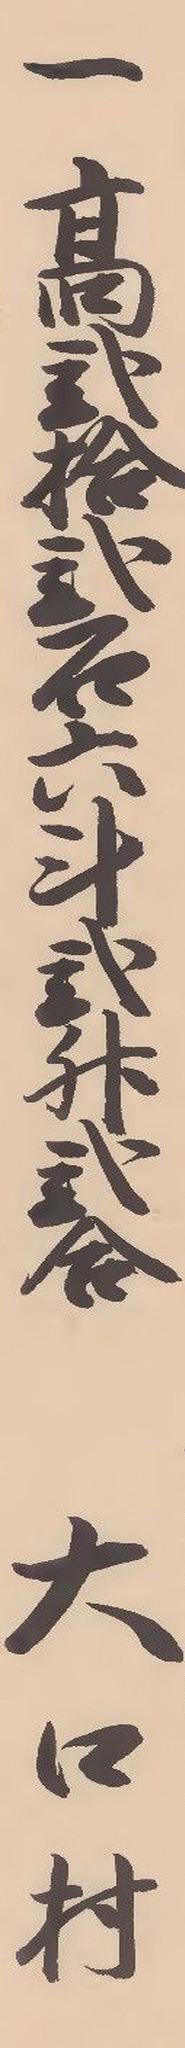一高弐拾弐石六斗弐升弐合大口村

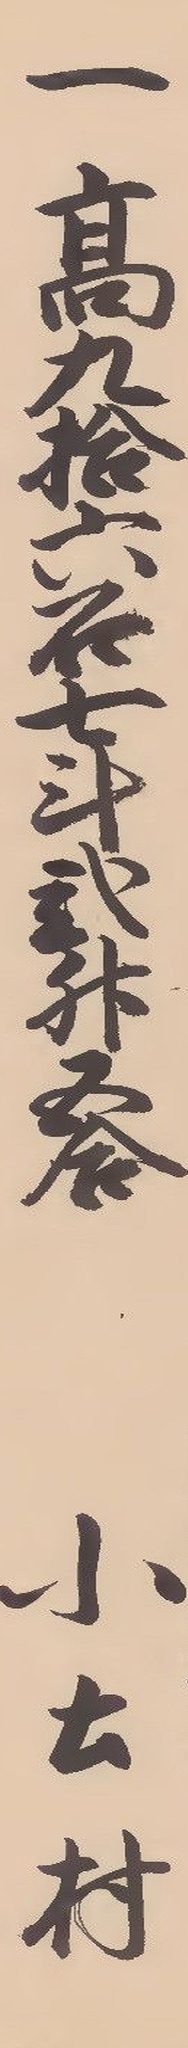一高九拾六石七斗弐升五合小土村
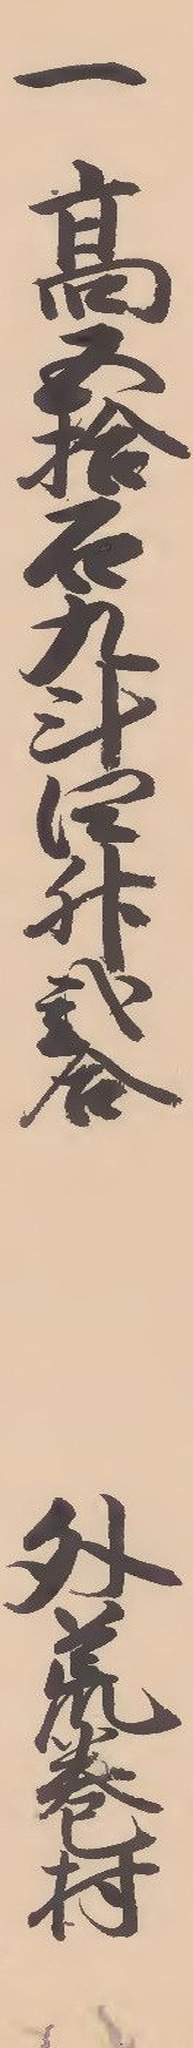一高五拾石九斗四升弐合外荒巻村
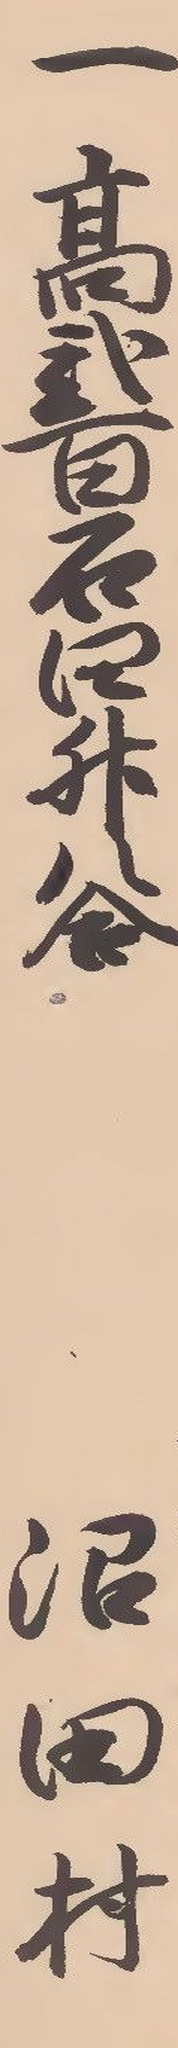一高弐百石四升八合沼田村
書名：出羽国郷帳　５
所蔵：国立公文書館 National Archives of Japan
